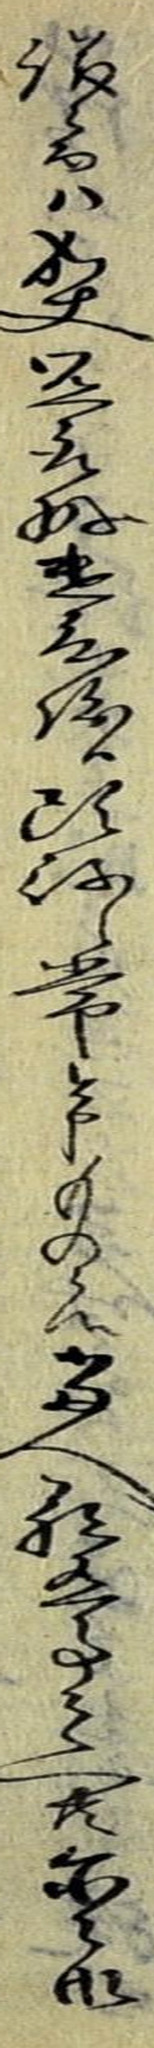議ニ而ハ成丈宜取扱遣度儀ハ頭役之常と申ものニ候当人難有事ニ候へ共尓々御
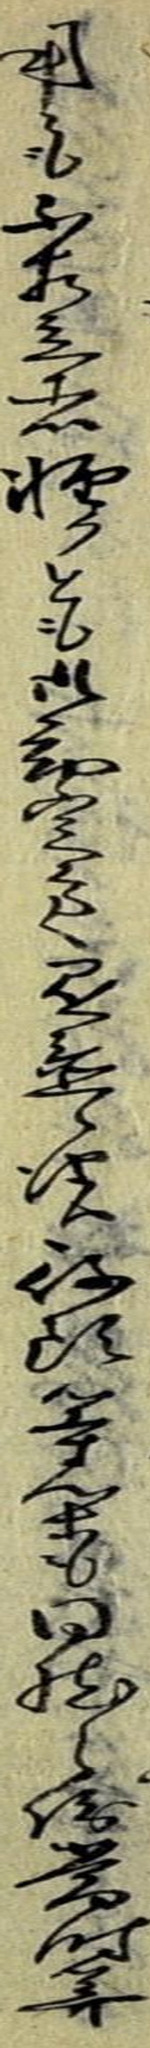用ニも不相立者軽クとも御勘定方へ懸置候儀ハ役頭等閑も同然之儀当時算
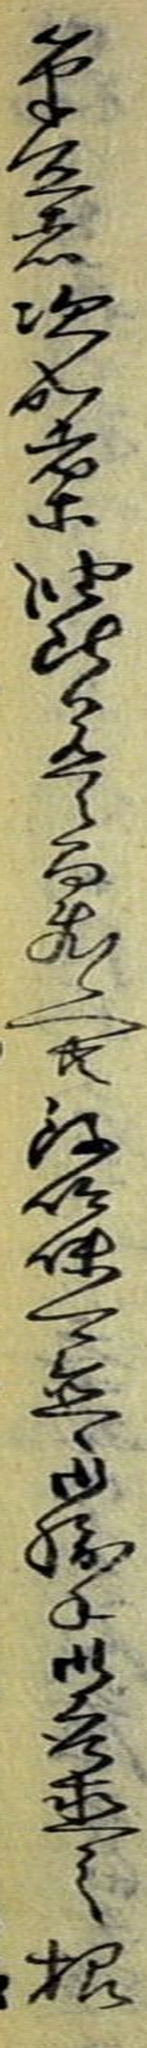筆宜者次成者等油断ハ有之間敷候へ共役吟味可置候御勝手御取直之根
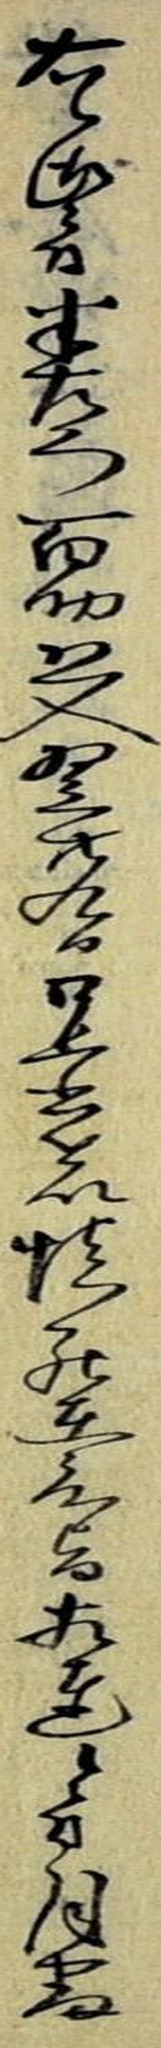右之趣ニ付半左衛門百助恐入翌廿九日口上書を以慎罷在度旨相達候ニ付月番
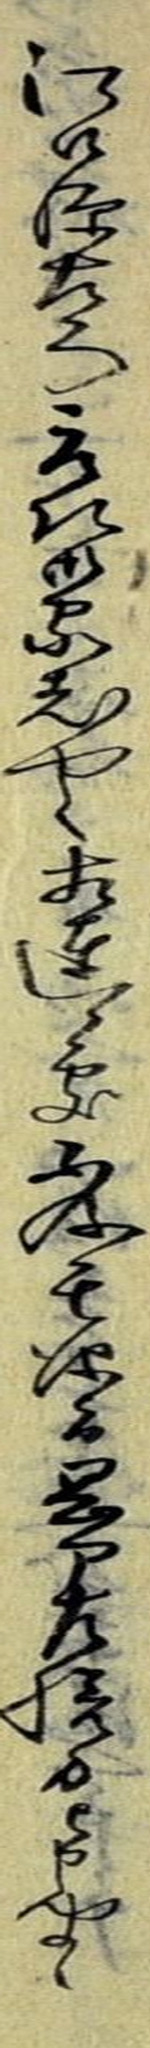江口源左衛門取次御家老中へ相達候処不及其儀旨岡部左膳方被申聞候
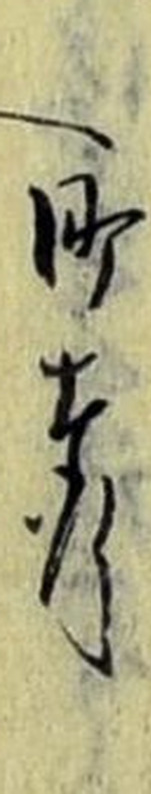町奉行
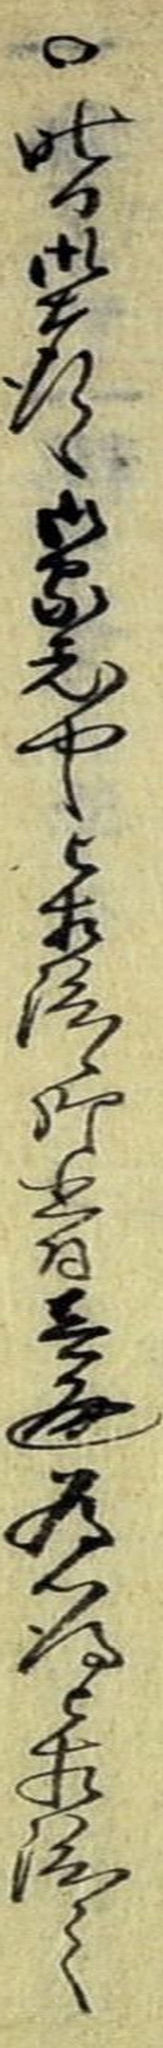〇昨日御奉行へ御家老中被相渡候御書付壱通為心得被相渡之
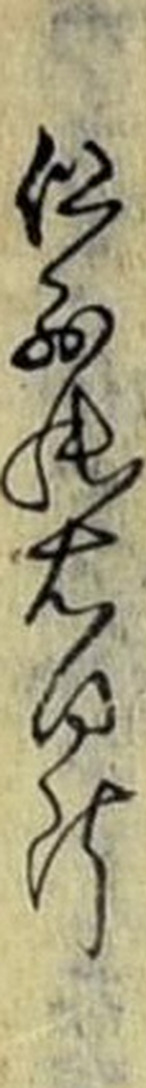但別紙右同断
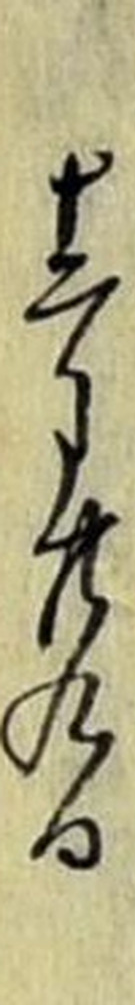十二月廿九日

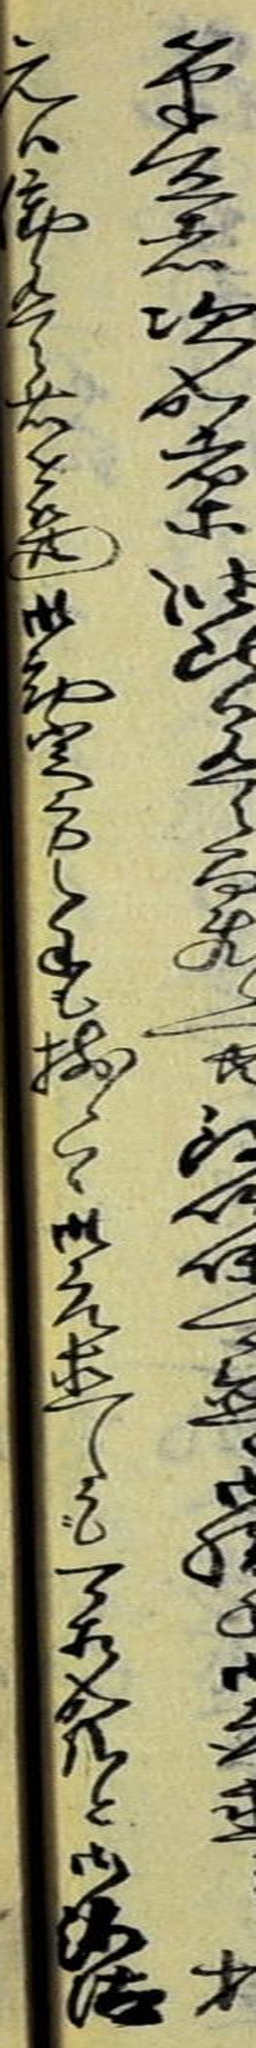元ハ働有之者を選御勘定方之手も揃候ハヽ御取直しニも可相成哉と御沙汰
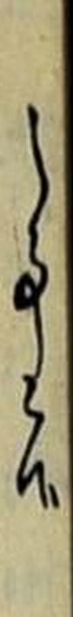之事ニ候

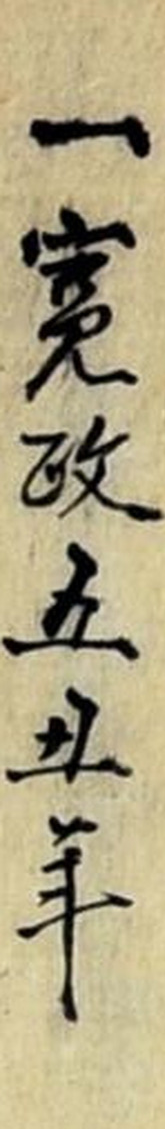一寛政五丑年
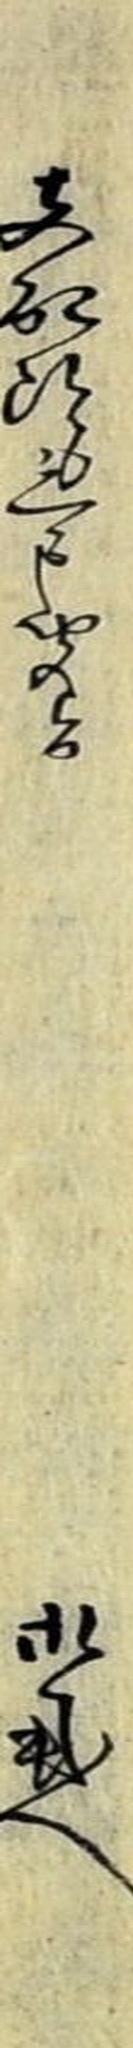支配頭へも可申聞旨御用人
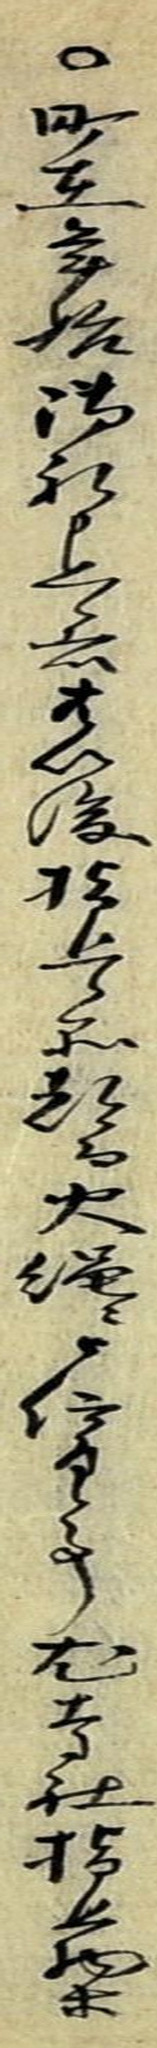〇町在年始御礼申上候者者以後指上候品都而火縄ニ被仰付候事尤寺社指上物等
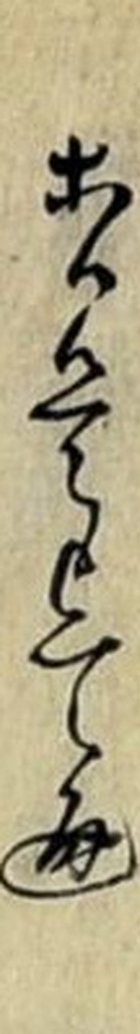等ハ是迄之通
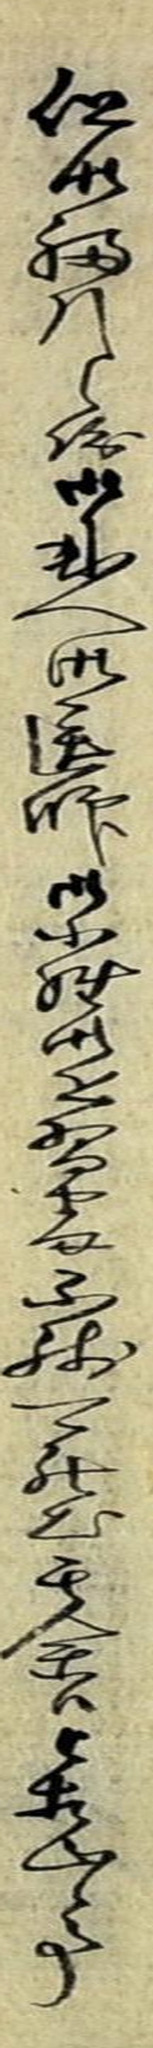但御福引之儀御用人御医師御小姓御近習番不残可罷出其余ハ被相止候事
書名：命令之部 三
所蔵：福井県文書館 Fukui Prefectural Archives
